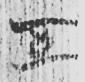五
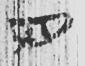四
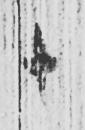十
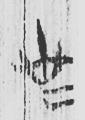卅=
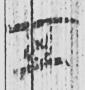五
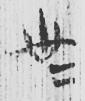卅=
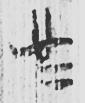廿=
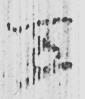五
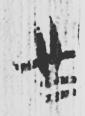廿=
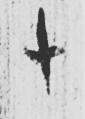十
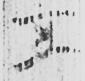五
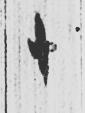十
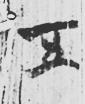五
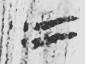二
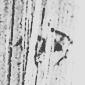刖
